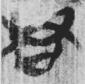君
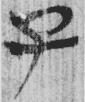子
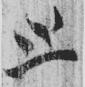之
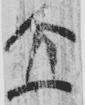立
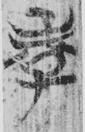孝
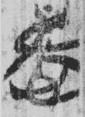○（愛）
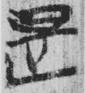是
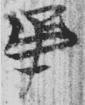甬（用）
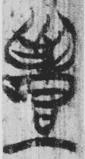豊（禮）
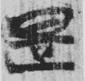是
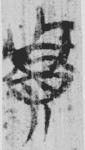貴
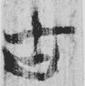古（故）
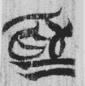爲
